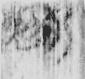所
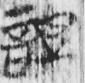○（屬）
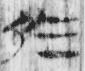於
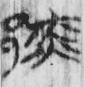郯
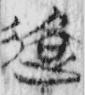○（路）
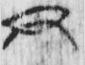尹
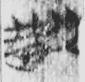荊（荆）
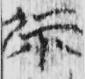𫵖
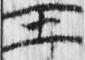壬
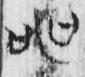申
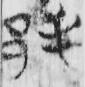○（求）
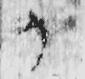人
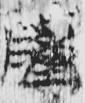○（陳）
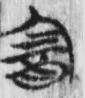酓（熊）
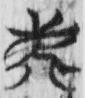鹿
